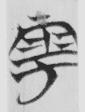𩁹
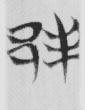邦
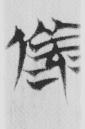備
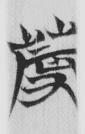蓐
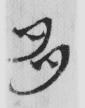多
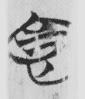食
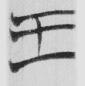王
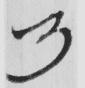乃
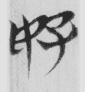好
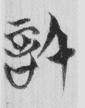信
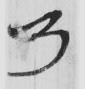乃
